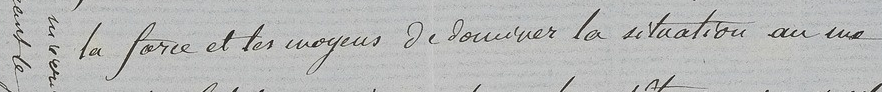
la force et les moyens de dominer la situation au mo-
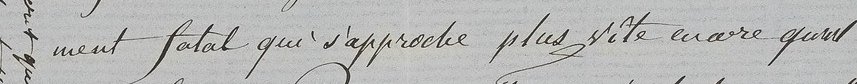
ment fatal qui s'approche plus vîte encore quant
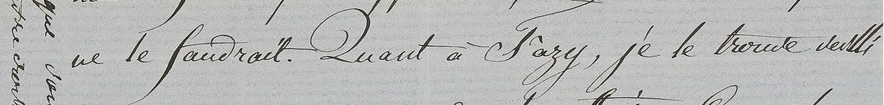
ne le faudrait. Quant à Fazy, je le trouve veilli
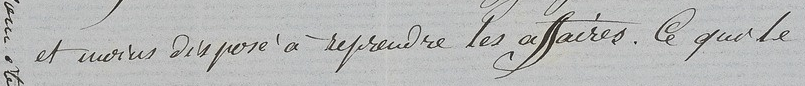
et moins disposé à reprendre les affaires. Ce qui le
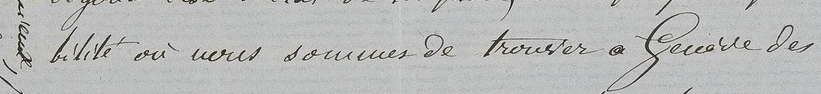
bilité où nous sommes de trouver a Genève des
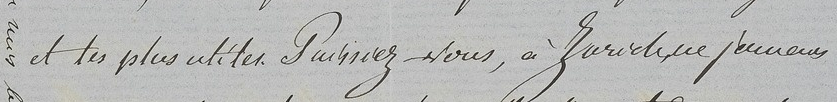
et les plus utiles. Puissiez-vous, à Zurich, ne jamais
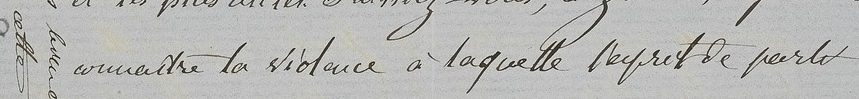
connaître la violence à laquelle l'esprit de parti
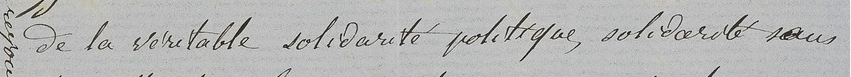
de la véritable solidarité politique, solidarité sans
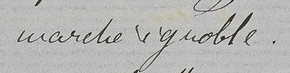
marche ignoble.
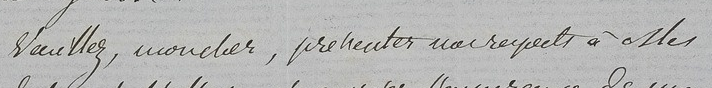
Veuillez, mon cher, présenter nos respects à Mes
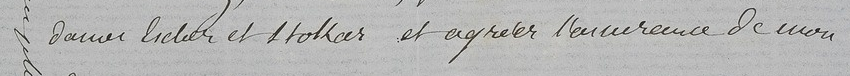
Dames Escher et Stokar et agréer l'assurance de mon
